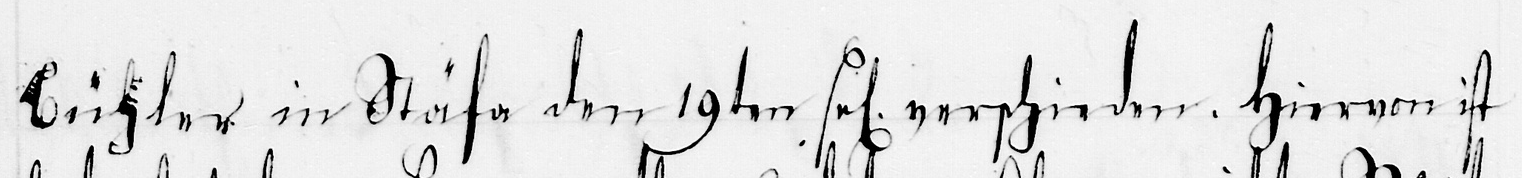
Bühler in Stäfa den 19ten sel[ig] verschieden. Hiervon ist
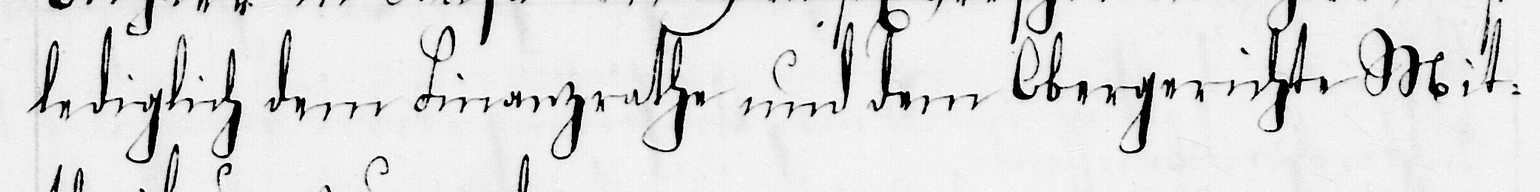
lediglich dem Finanzrathe und dem Obergerichte Mit¬
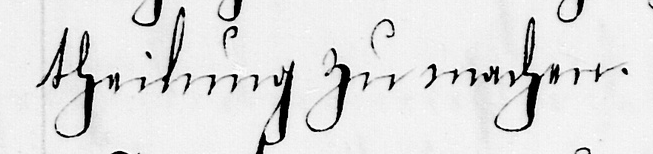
theilung zu machen.
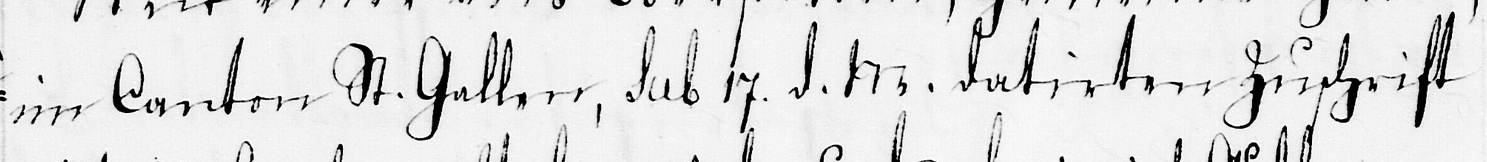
im Canton St. Gallen, sub 17. d. M. datirten Zuschrift
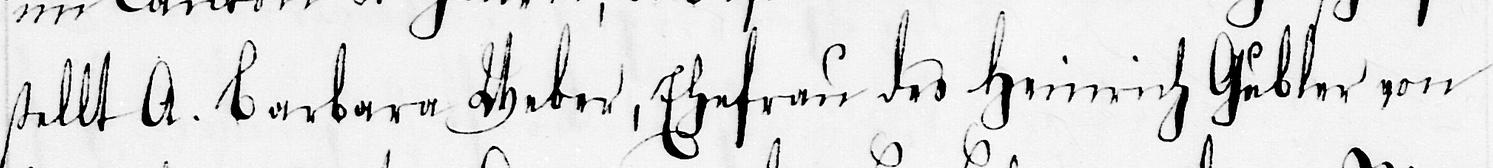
tellt A. Barbara Weber, Ehefrau des Heinrich Gubler von
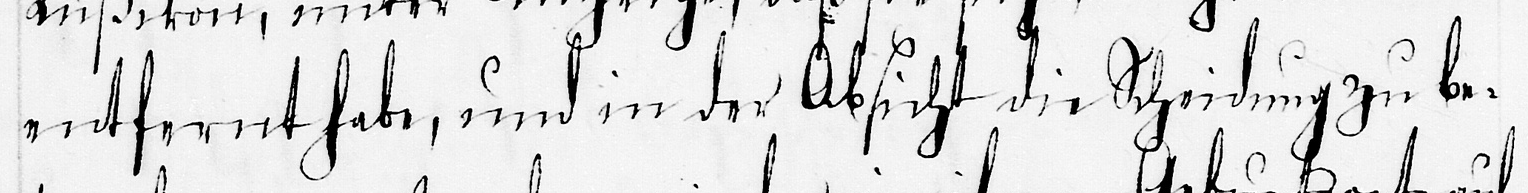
entfernt habe, und in der Absicht die Scheidung zu be¬
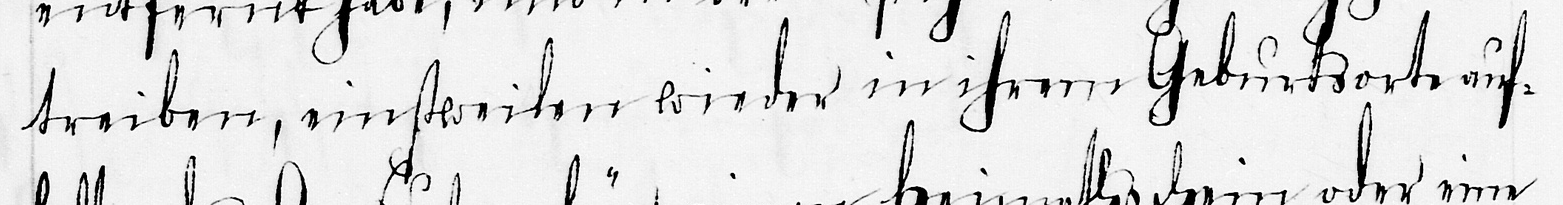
treiben, einstweilen wieder in ihrem Geburtsorte auf¬
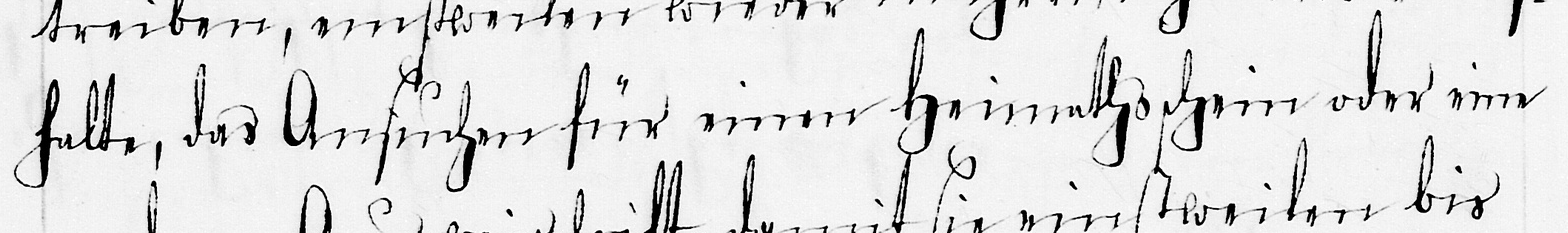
halte, das Ansuchen für einen Heimathschein oder eine
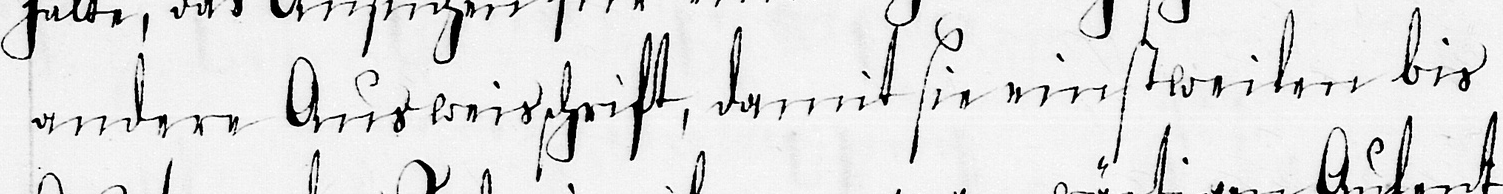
andere Ausweisschrift, damit sie einstweilen bis
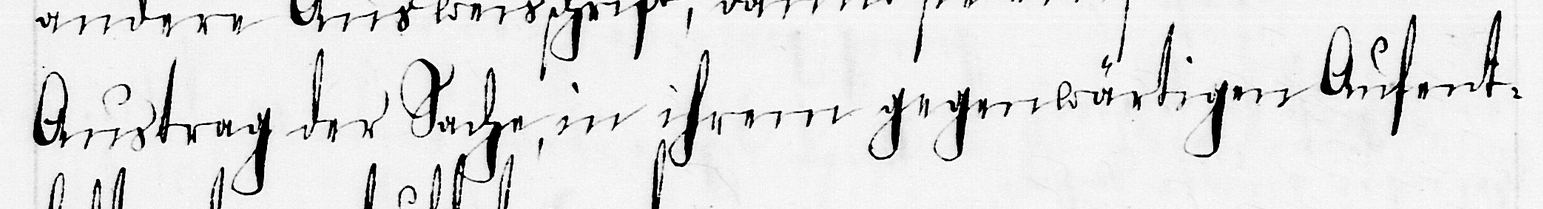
Austrag der Sache, in ihrem gegenwärtigen Aufent¬
